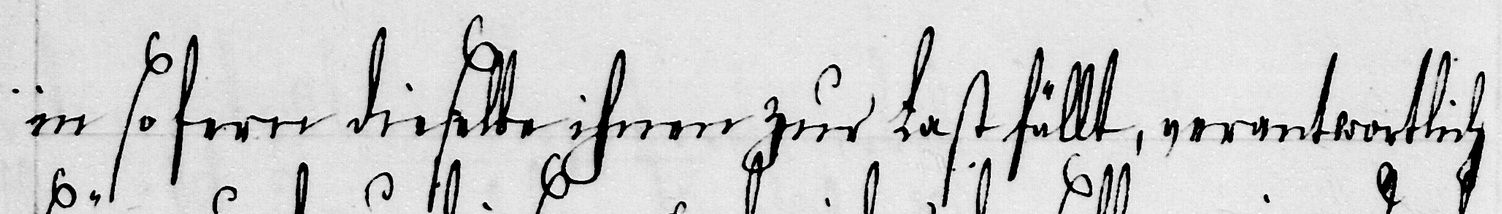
in so fern dieselbe ihnen zur Last fällt, verantwortl¬
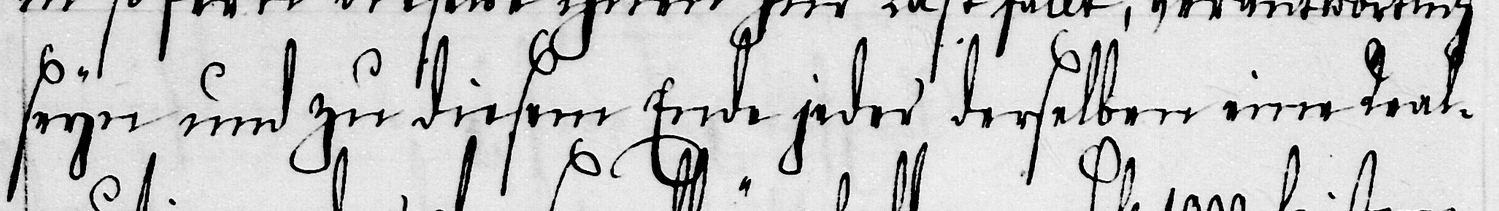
seyn und zu diesem Ende jeder derselben eine Real¬
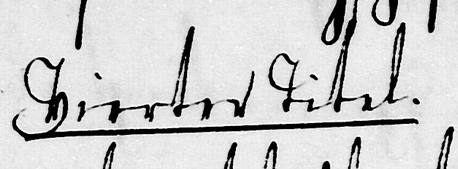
Vierter Titel.
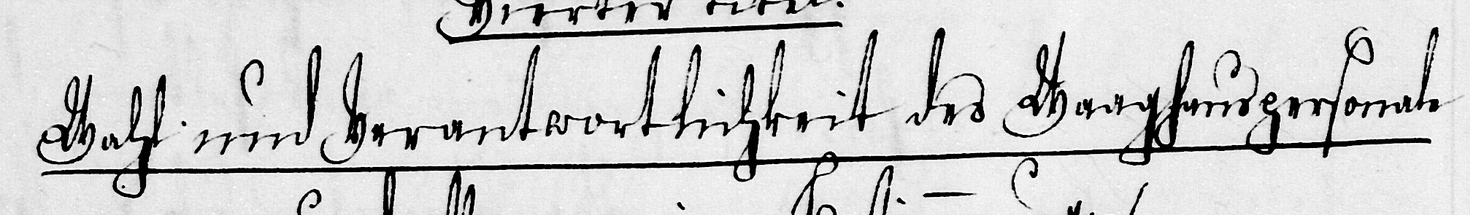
Wahl und Verantwortlichkeit des Waaghauspersonale
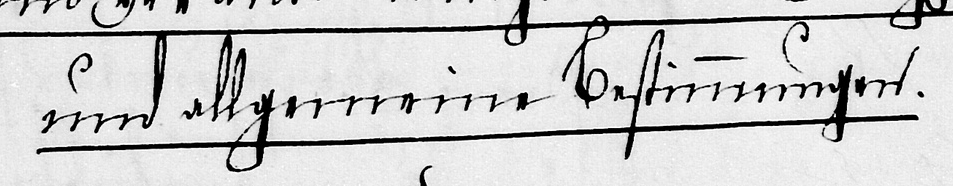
und allgemeine Bestimmungen.
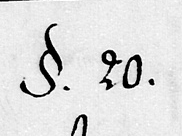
§. 20.
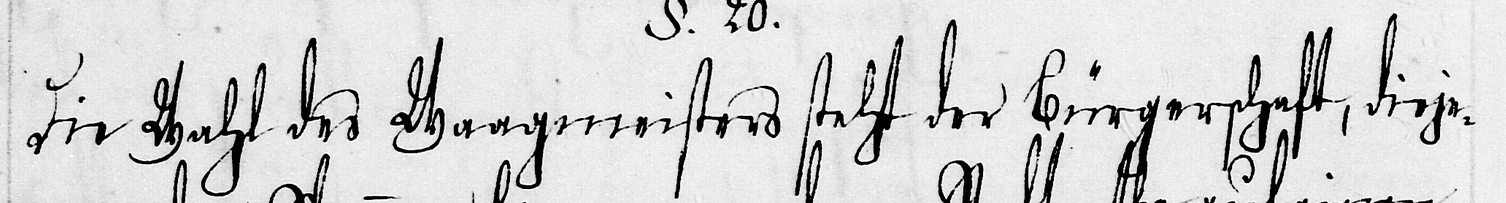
Die Wahl des Waagmeisters steht der Bürgerschaft, diej¬
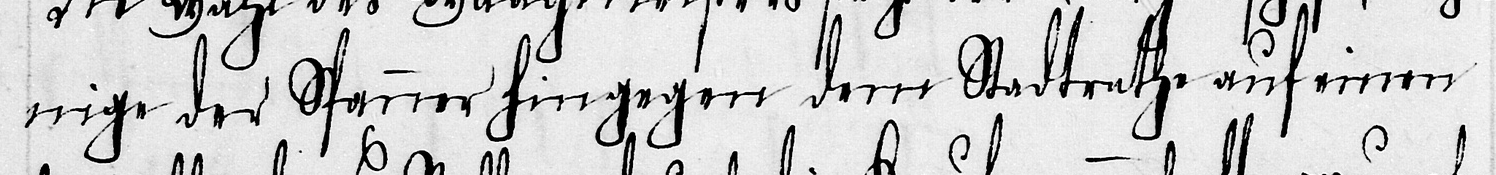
enige der Spanner hingegen dem Stadtrathe auf einen
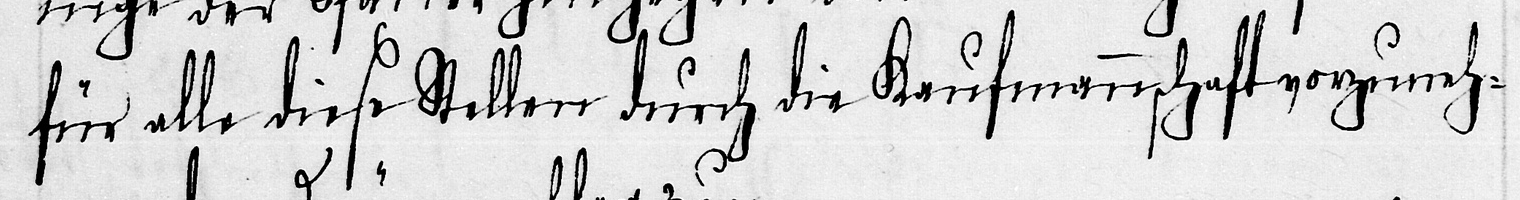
für alle diese Stellen durch die Kaufmannschaft vorzuneh¬
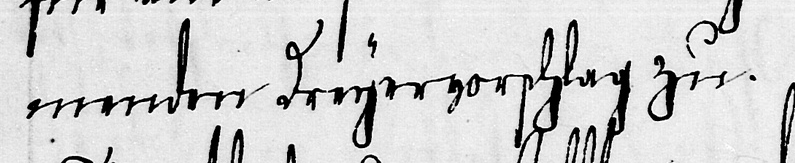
menden Dreyervorschlag zu.
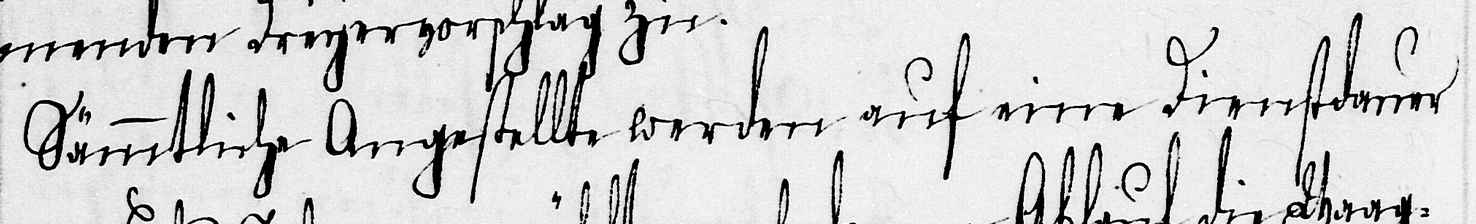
Sämmtliche Angestellte werden auf eine Dienstdauer
